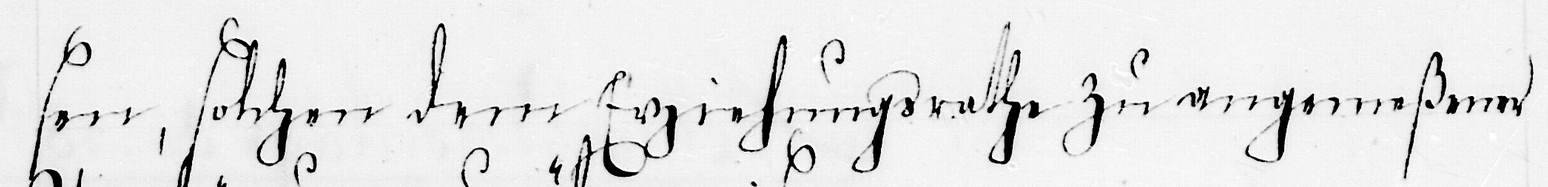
sen, solchen dem Erziehungsrathe zu angemeßener
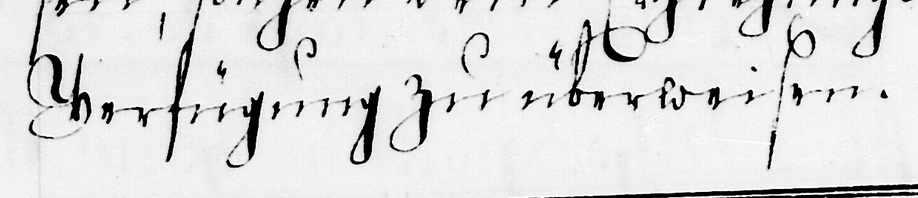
Verfügung zu überweisen.
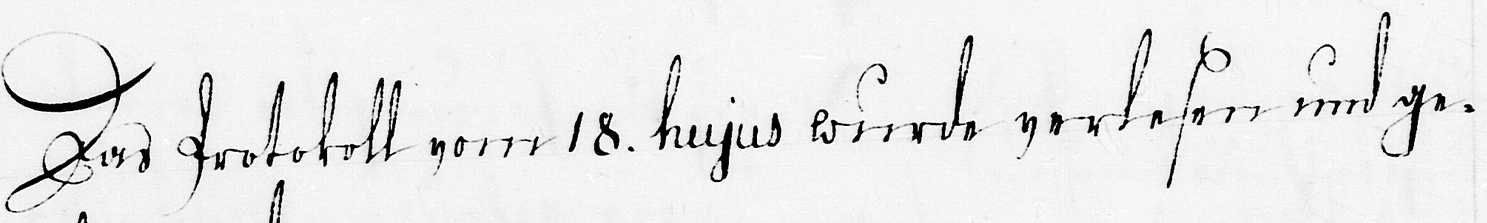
Das Protokoll vom 18. hujus wurde verlesen und ge¬
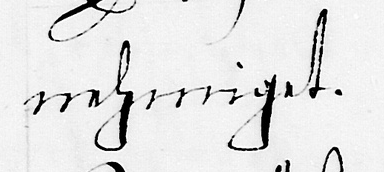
nehmiget.
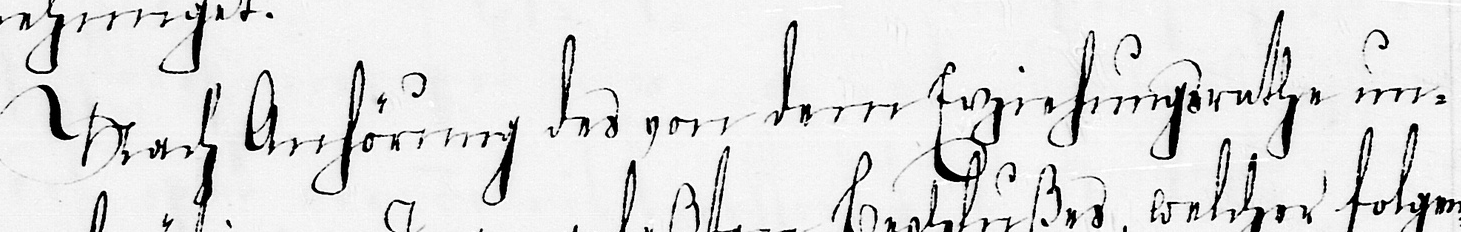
Nach Anhörung des von dem Erziehungsrathe un¬
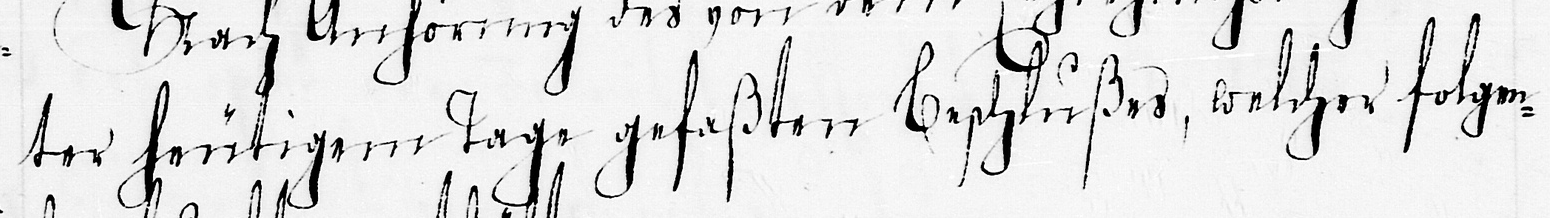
ter heutigem Tage gefaßten Beschlußes, welcher folgen¬
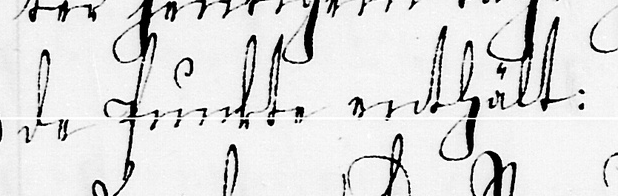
de Punkte enthält:
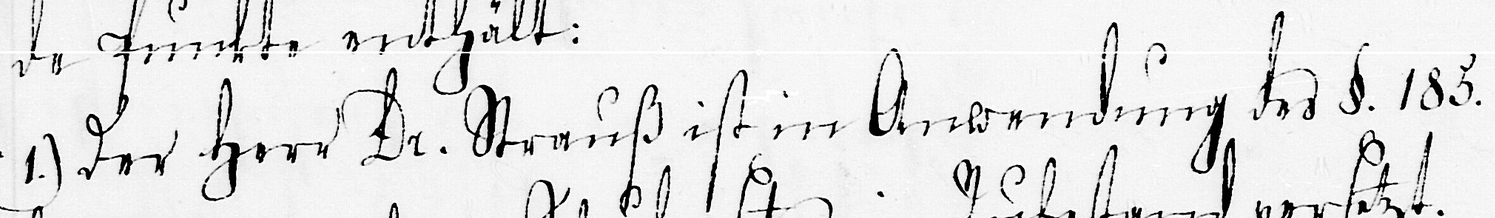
1.) Der Herr Dr. Strauß ist in Anwendung des §. 185.
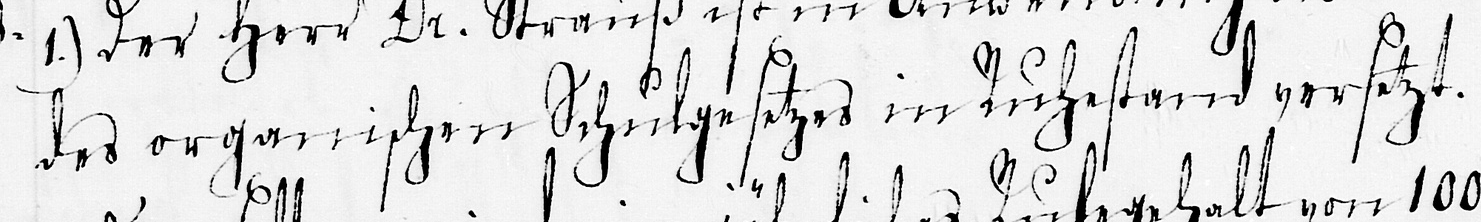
des organischen Schulgesetzes in Ruhestand versetzt.
